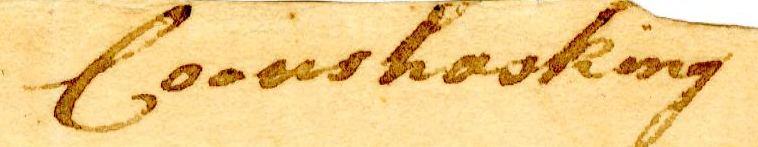Coonshosking
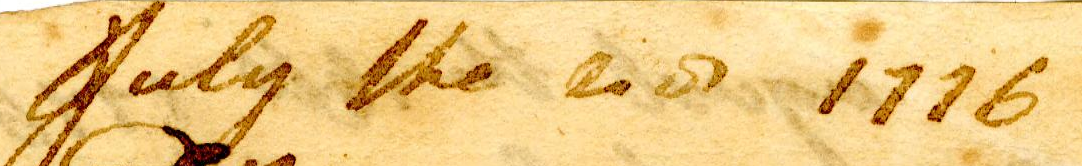July the 28 1776
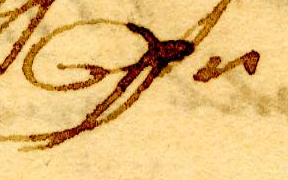D^r
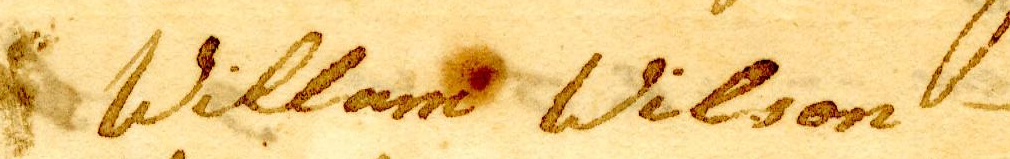Willam Wilson
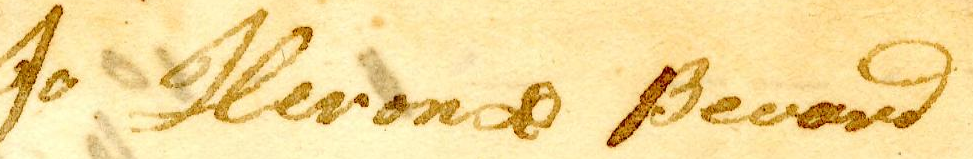To Herond Bevard
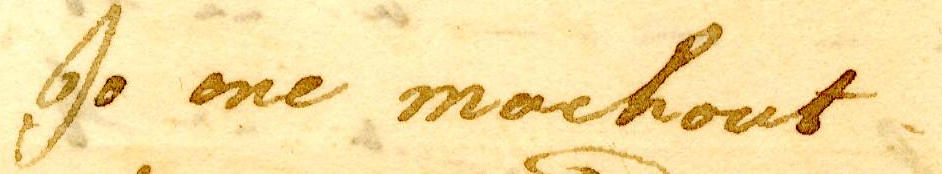To one machout
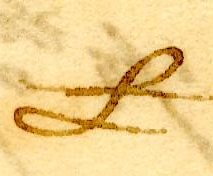£
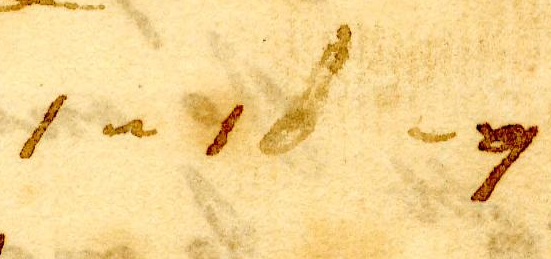I - 10 - 9
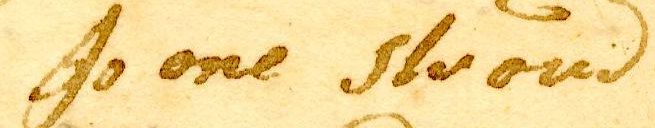To one sleoud
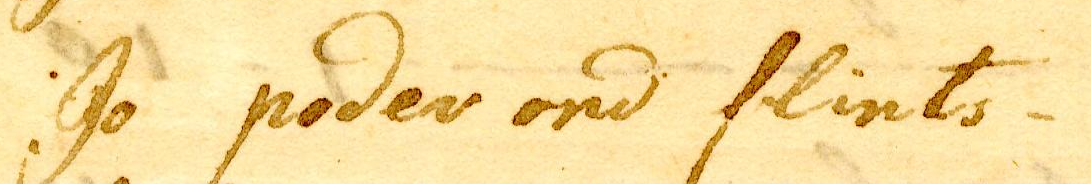To poder and flints-
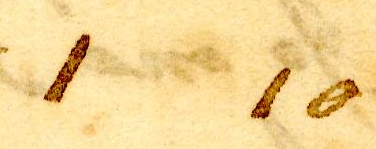1 10
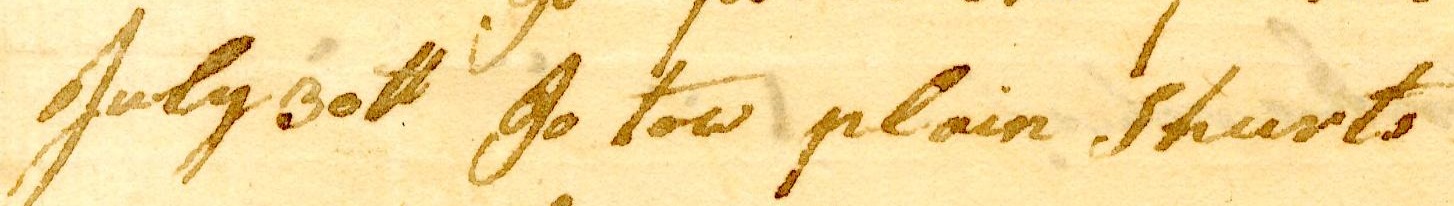July 30^th To tow plain Shurts
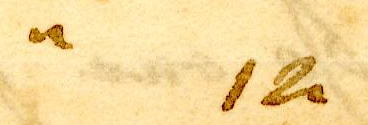- 12 -
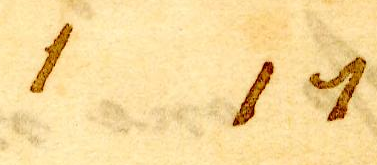1 17
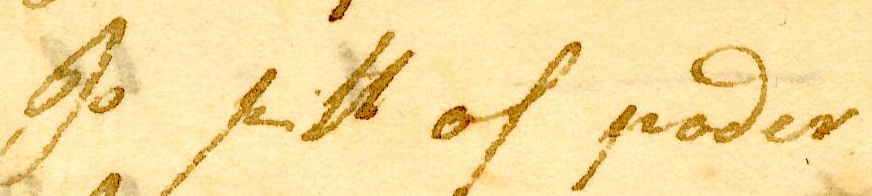To pill of poder-
